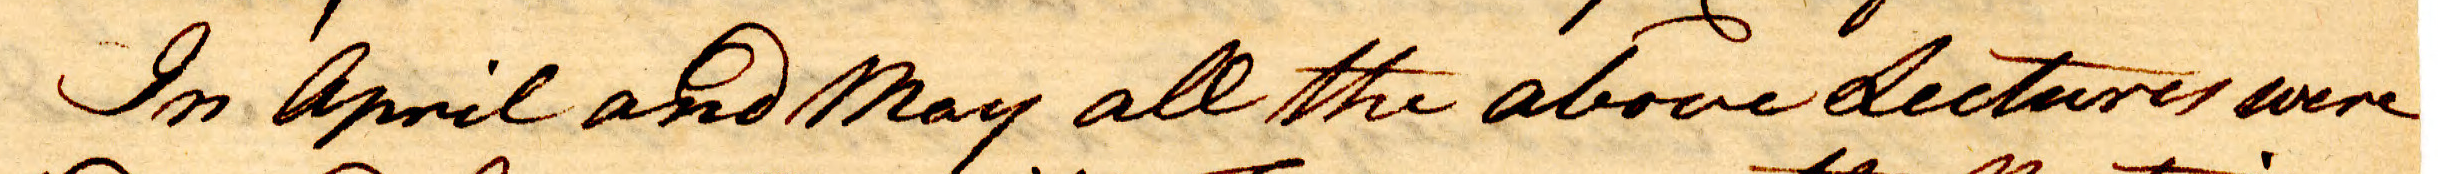In April and May all the above Lectures were
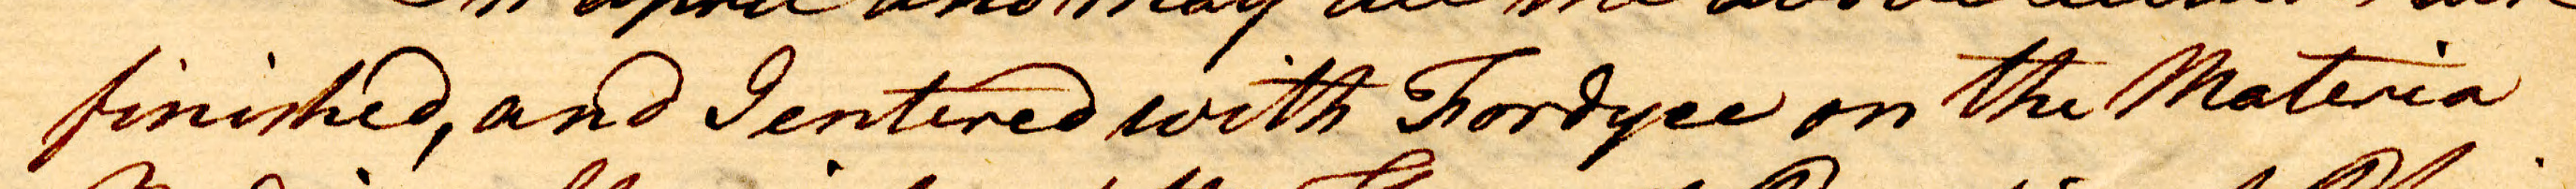finished, and I entered with Fordyce on the Materia
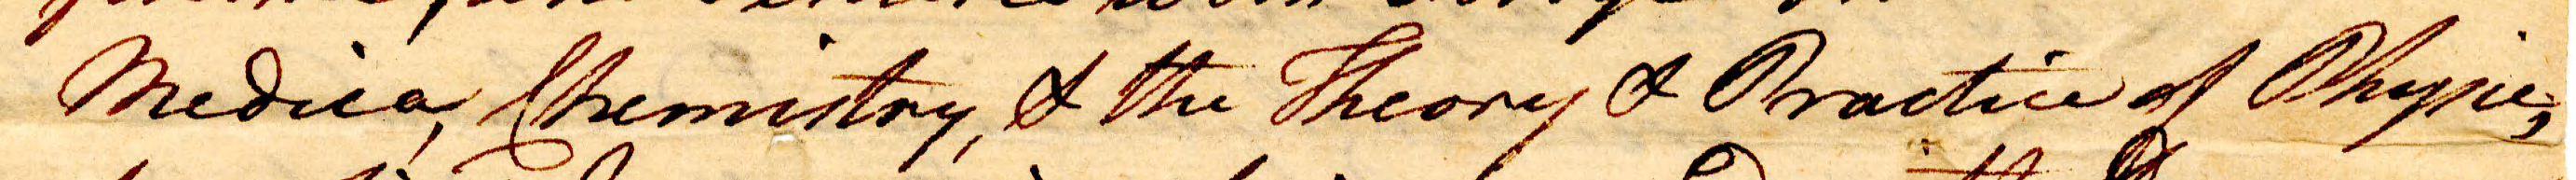Medica, Chemistry, & the Theory & Practice of Physic,
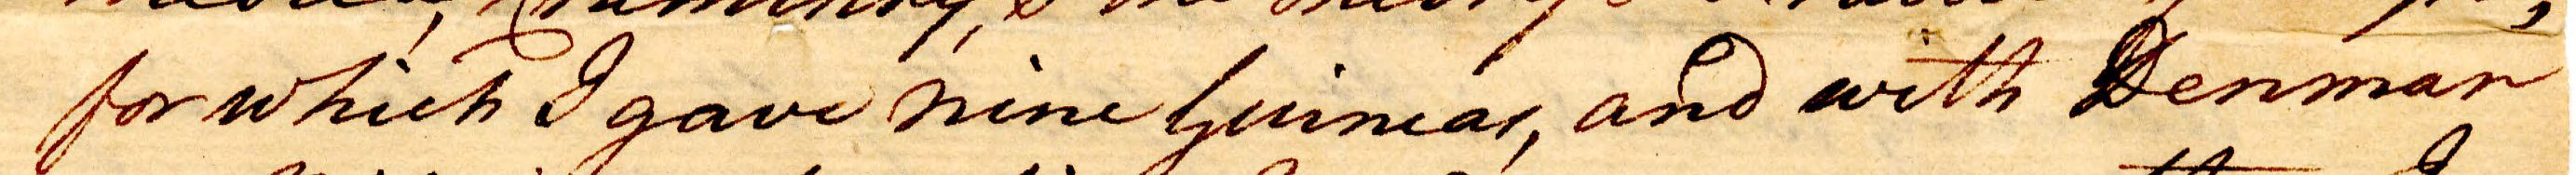for which I gave nine Guineas, and with Denman
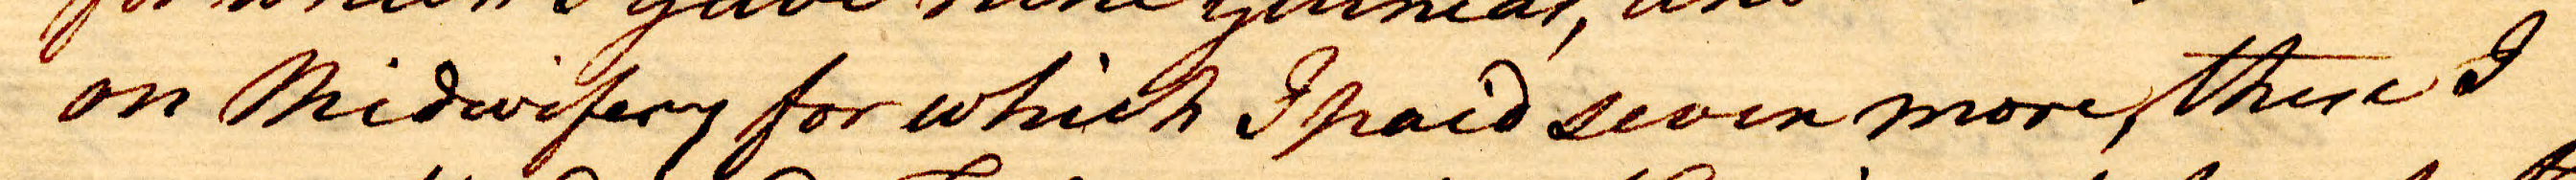on Midwifery for which I paid seven more, these I
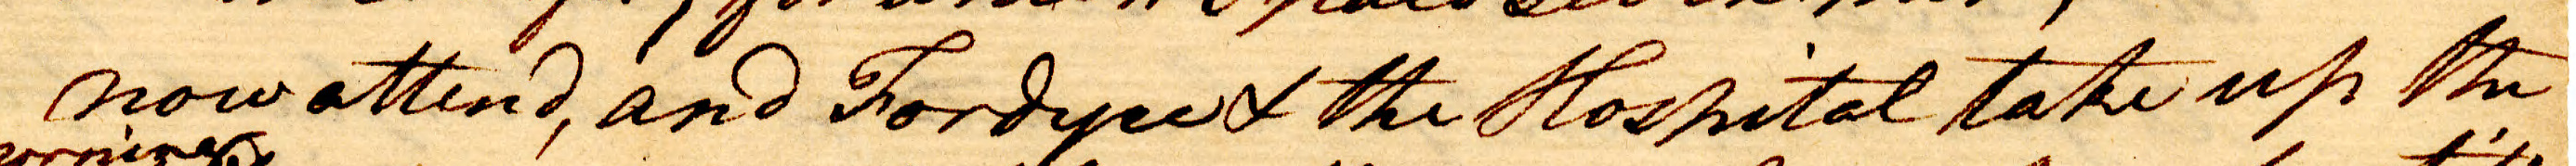now attend, and Fordyce & the Hospital take up the
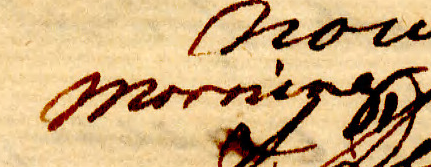morning
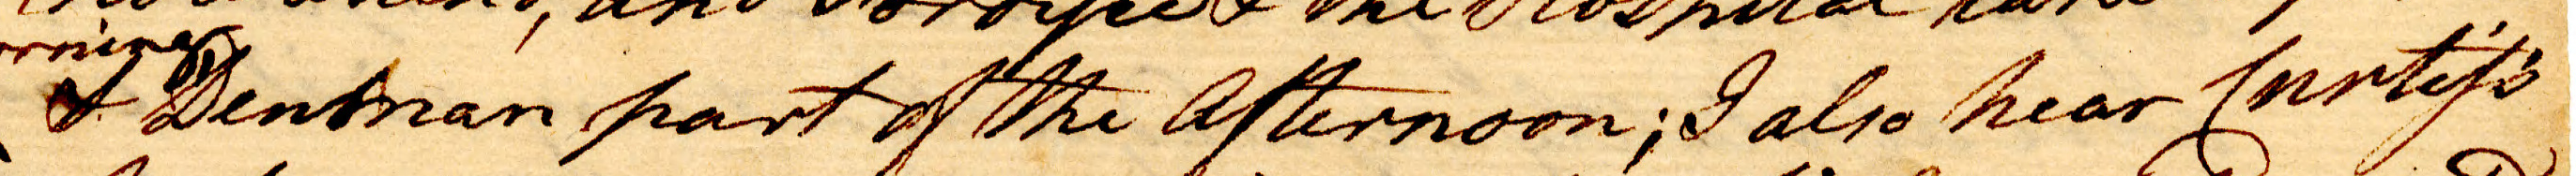& Denman part of the Afternoon; I also hear Curtis's
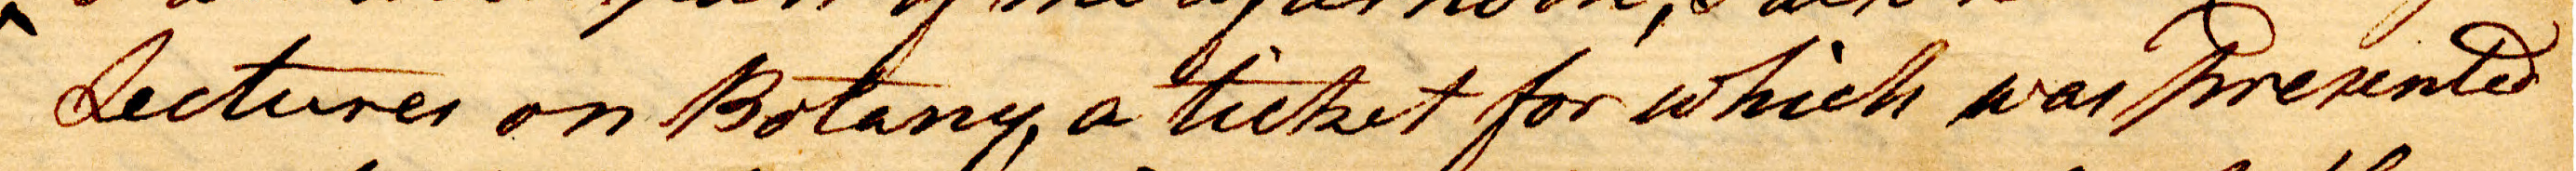Lectures on Botany, a ticket for which was presented
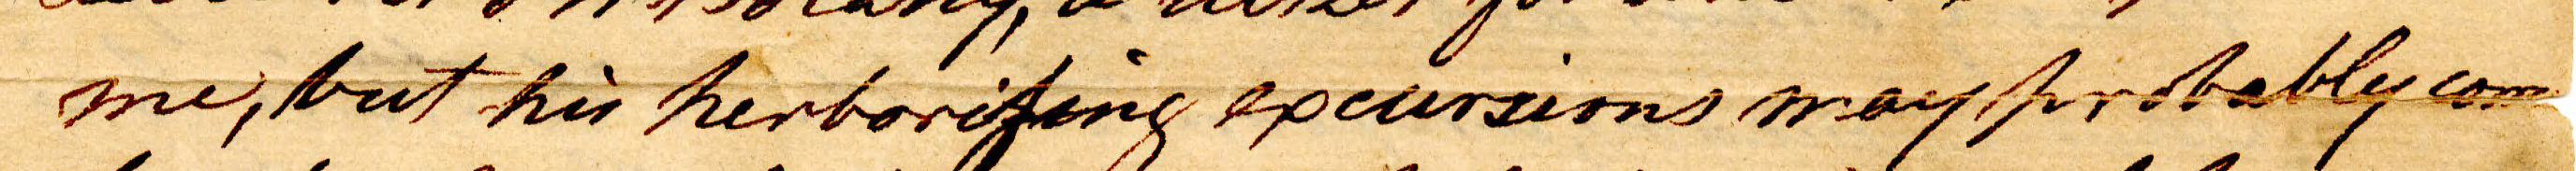me, but his herborizing excursions may probably com
